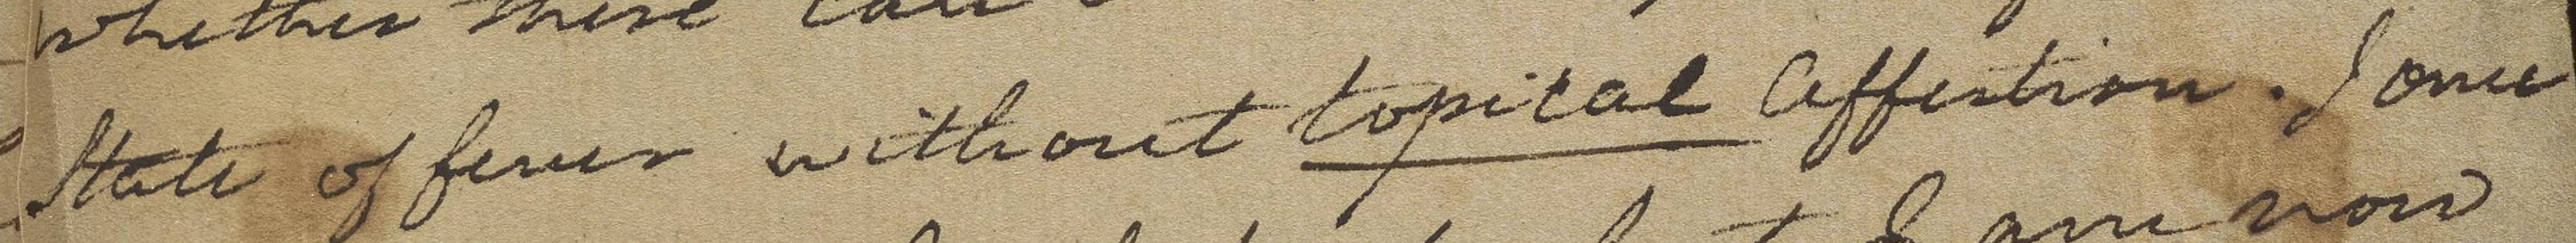state of fever without topical affection. I once
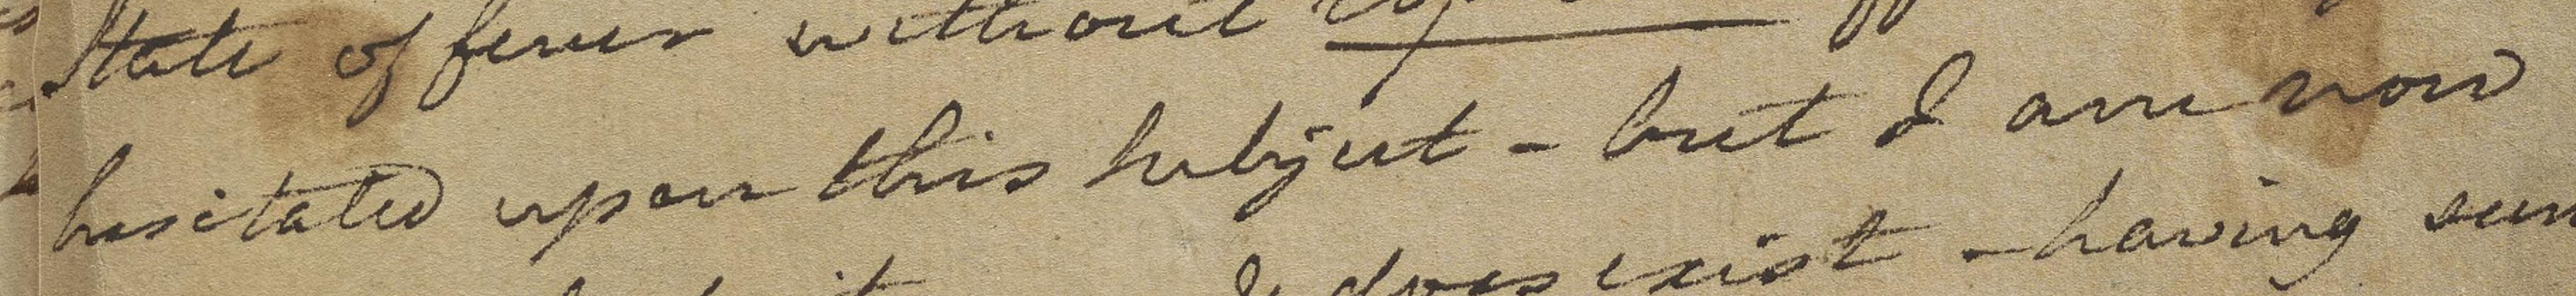hesitated upon this subject, but I am now
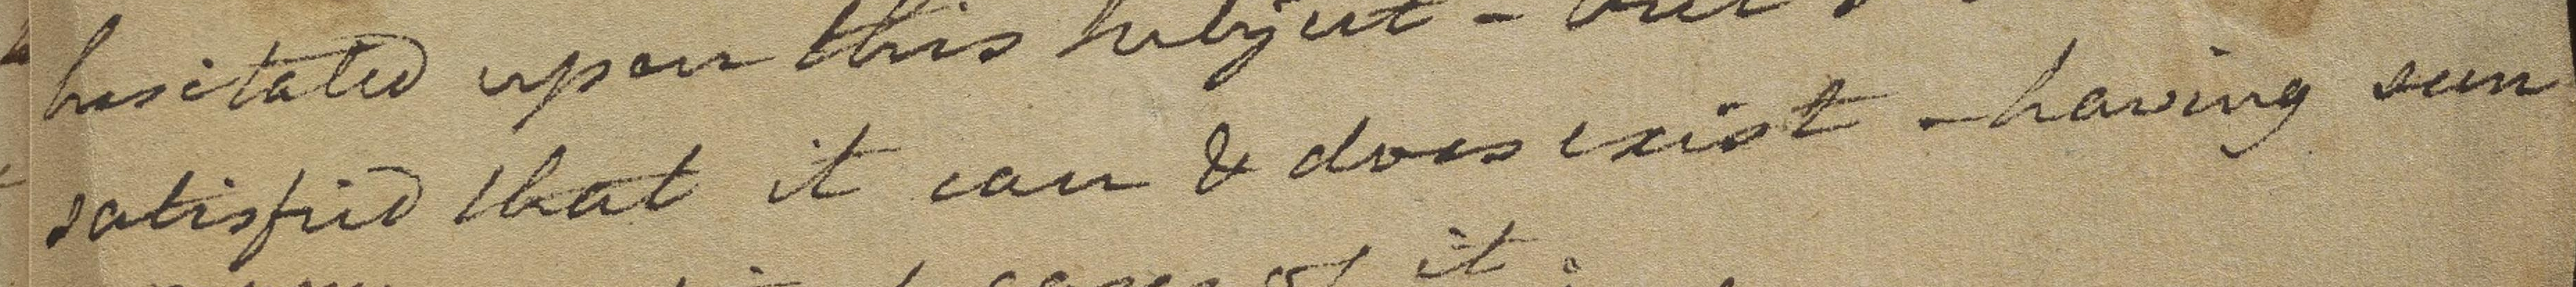satisfied that it can & does exist, having seen
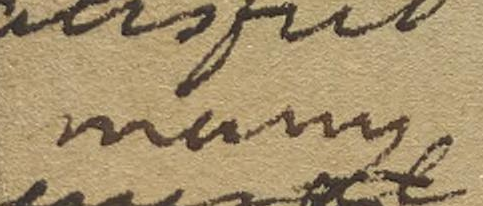many
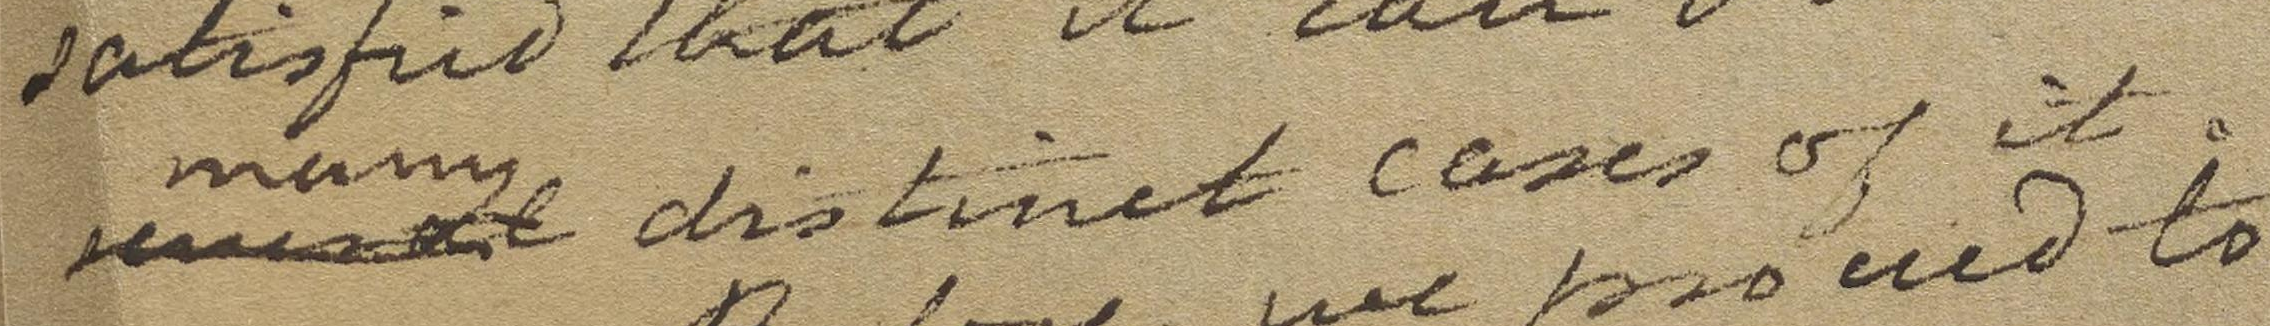[several] distinct cases of it.
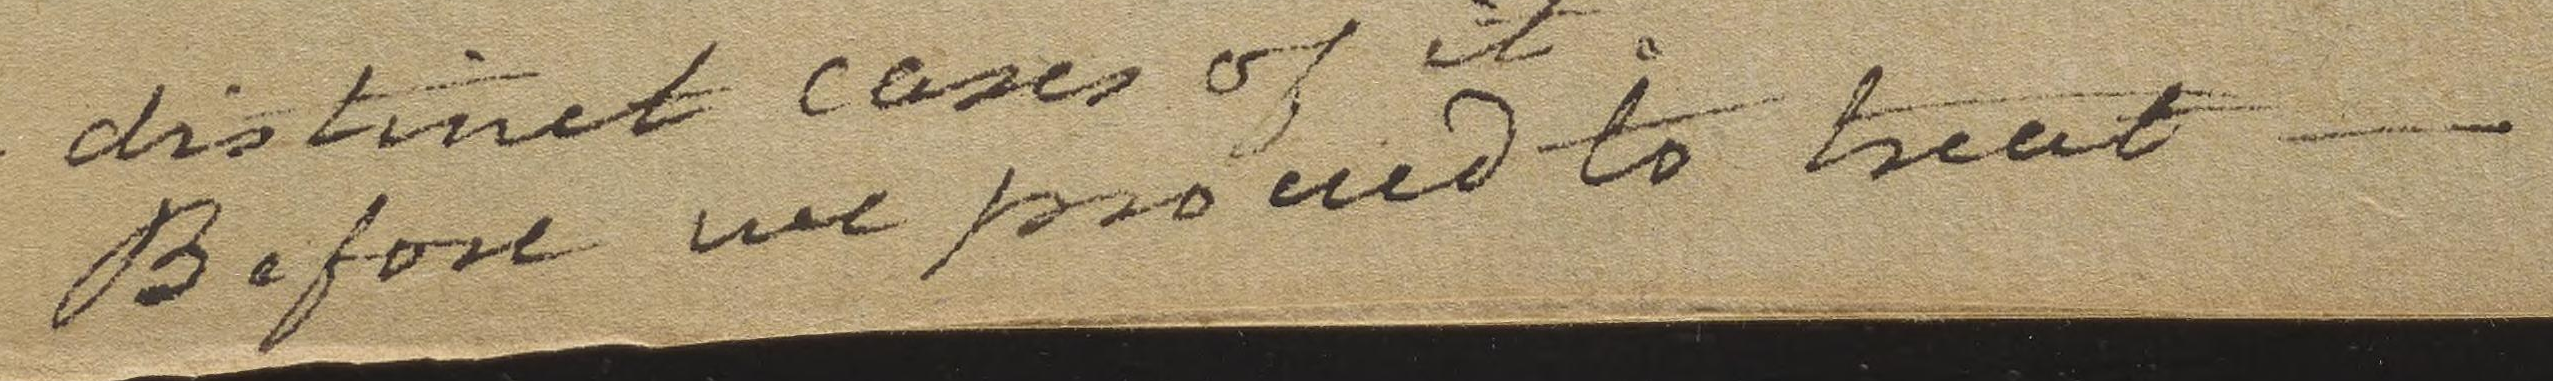Before we proceed to heat
